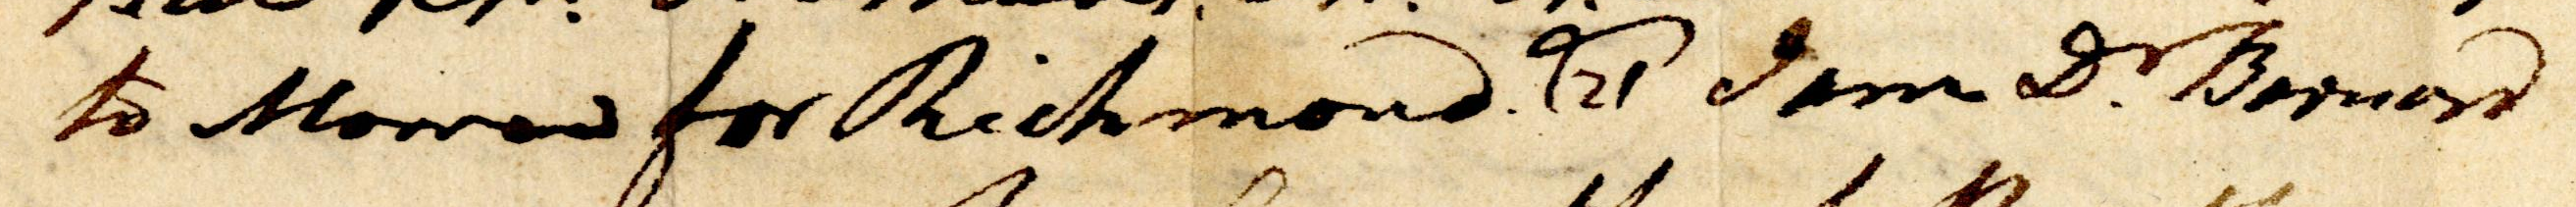to Morrow for Richmond [__] I am D^r. Barnard
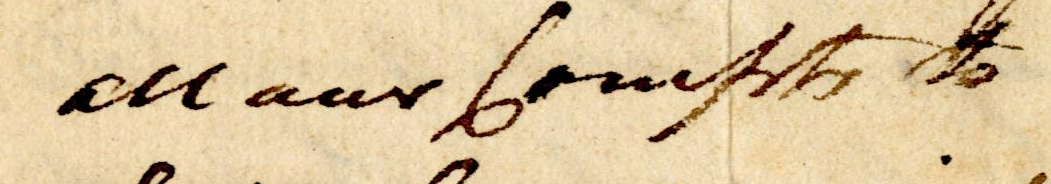All our Compts to
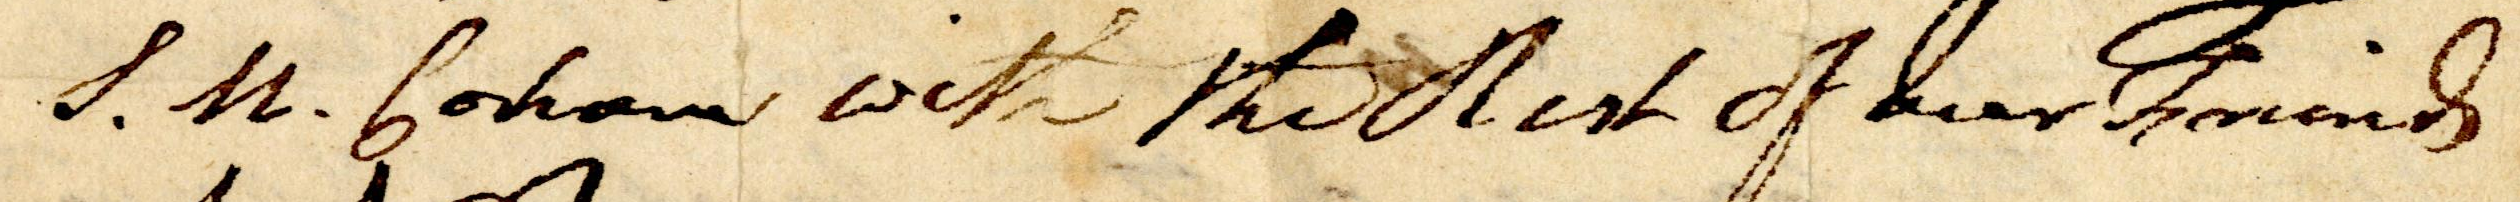S. M. Cohan with the rest of our friends
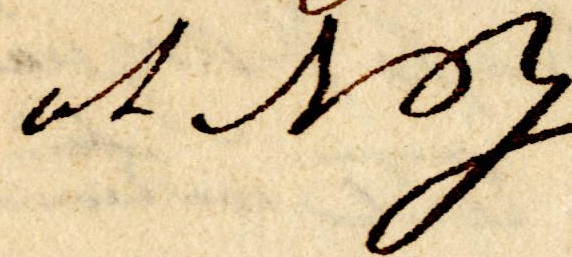at NY
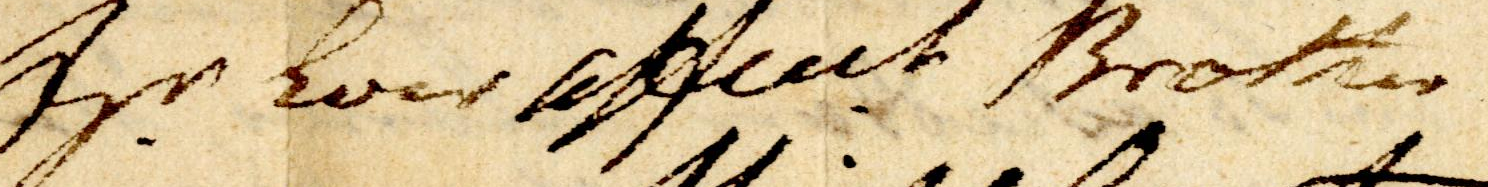f^r Ever affect brother
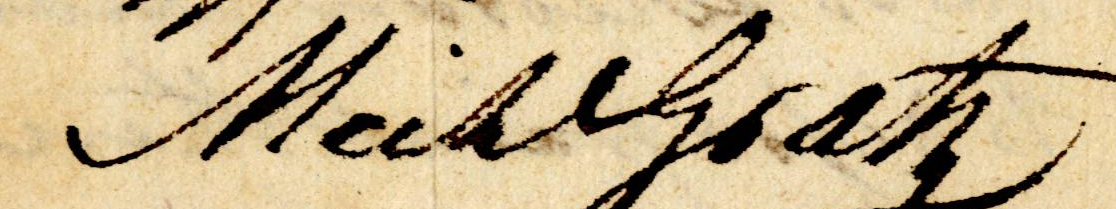Mich^l Gratz
